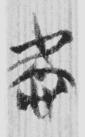{旡心}
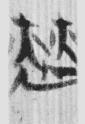勞
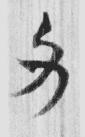力
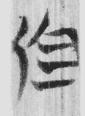於
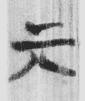亓
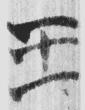王
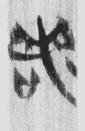若
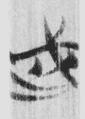武
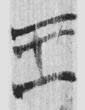王
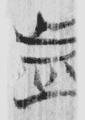者
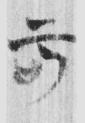可
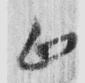㠯（以）
